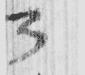乃
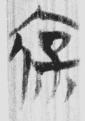{宀保}
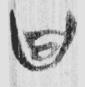昌
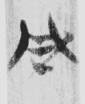凡
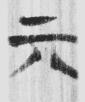亓
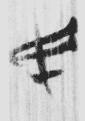民
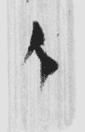人
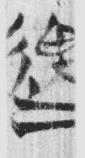{辶畀}
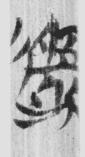{辶矛力}
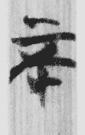不
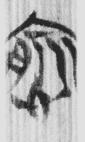愈
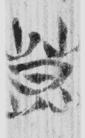莫
